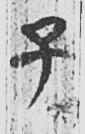子
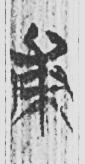甫
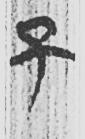子
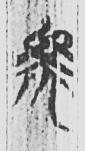虎
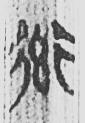率
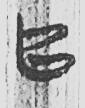𠂤
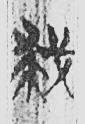{求戈}
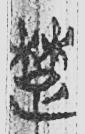楚
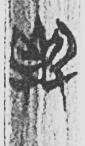與
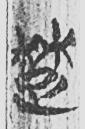楚
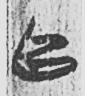𠂤
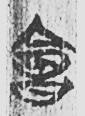會
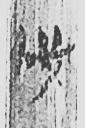伐
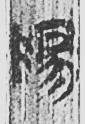陽
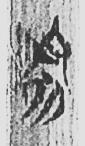{門夕刀}
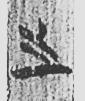之
